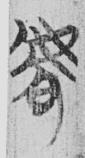○（乎）
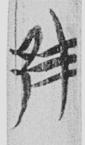隹（雖）
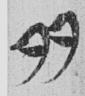多
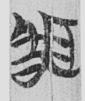○（聞）
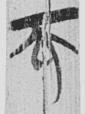而
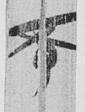不
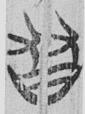○（友）
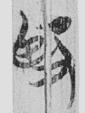臤（賢）
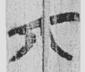亓（其）
